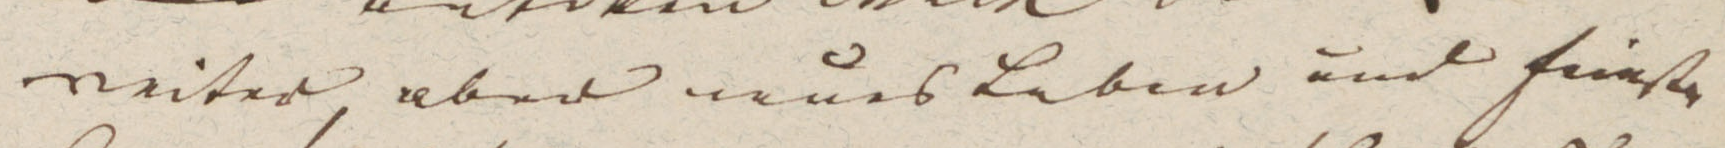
weiter, aber neues Leben und feinste
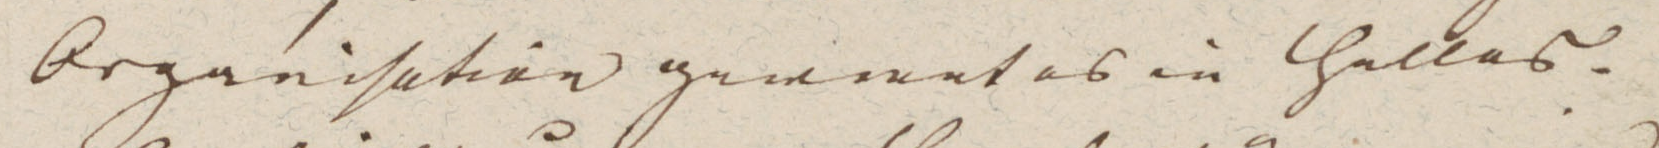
Organisation gewinnt es in Hellas.
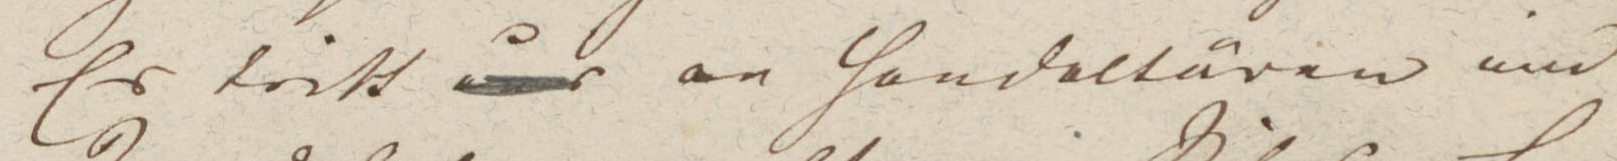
Es tritt uns an Handaltären und
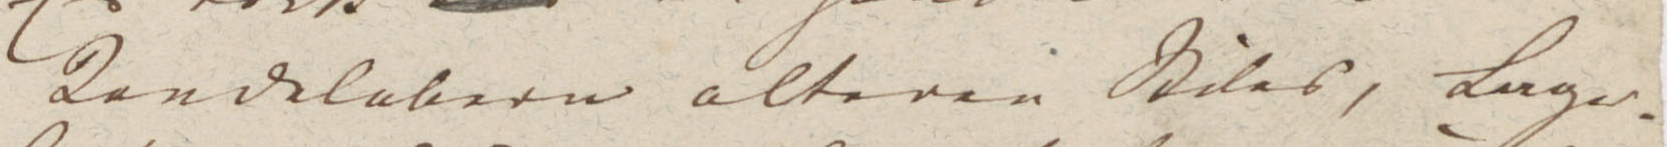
Kandelabern alteren Stiles, Lager-
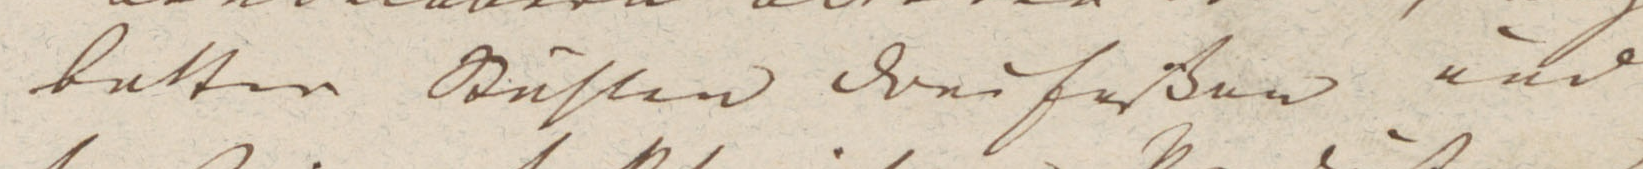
betten Stühlen Dreifüssen und
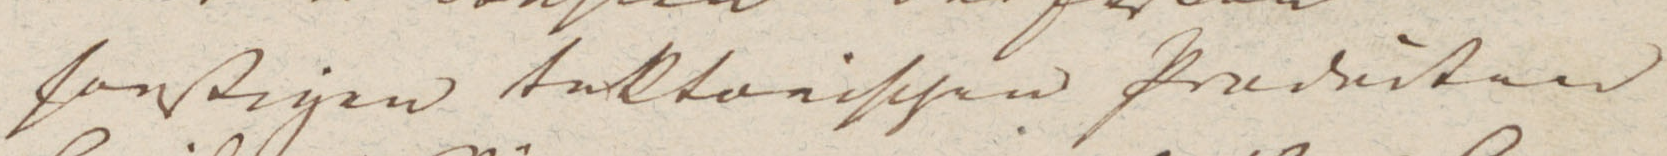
sonstigen tektonischen Producten
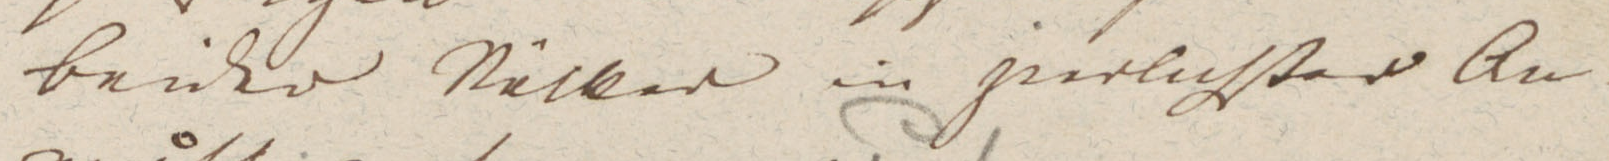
beider Völker in zierlichster An-
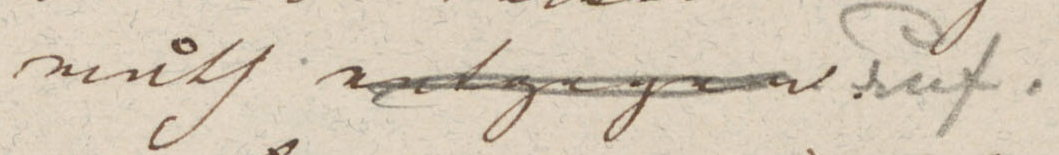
muth entgegen. auf.
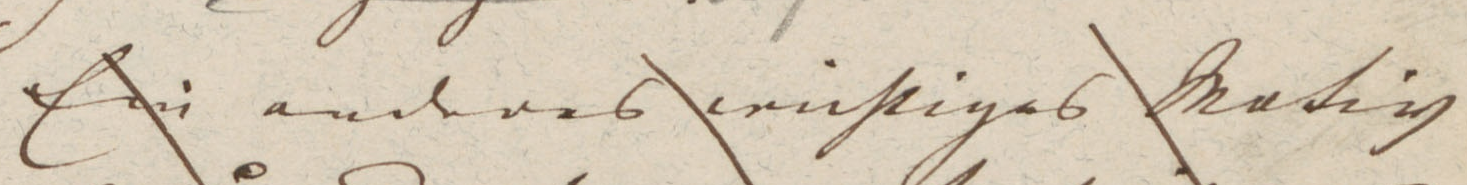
Ein anderes wichtiges Motiv
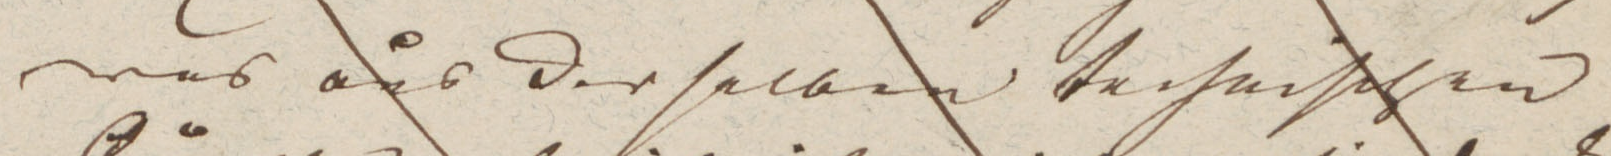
was aus der selben technischen
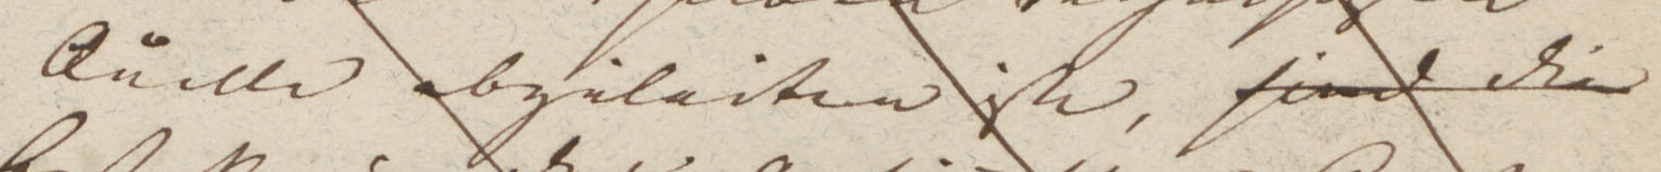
Quelle abzuleiten ist, sind die
